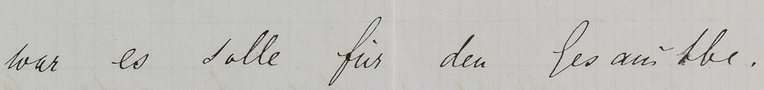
war es solle für den Gesamtbe-
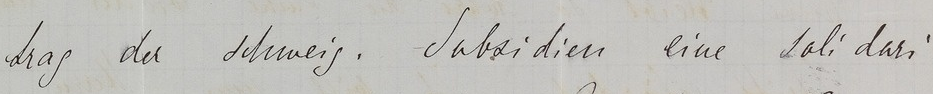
trag der schweiz. Subsidien eine solidari-
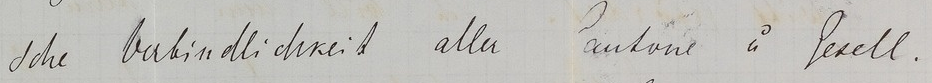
sche Verbindlichkeit aller Cantone u Gesell-
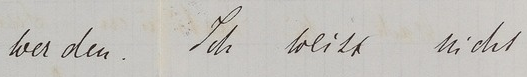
werden. Ich weiss nicht
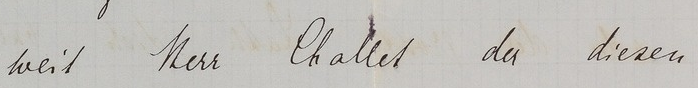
weit Herr Challet der diesen
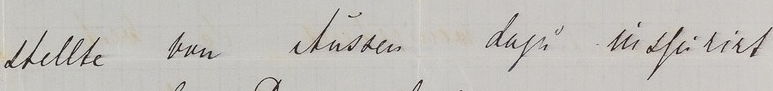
stellte von aussen dazu inspirirt
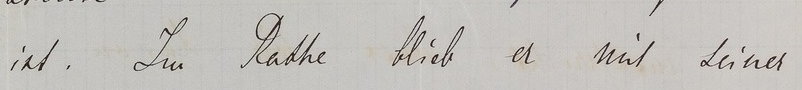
ist. Im Rathe blieb er mit seiner
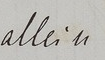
allein.
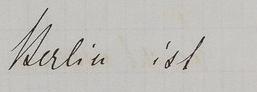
Berlin ist
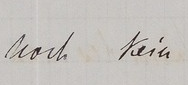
noch kein
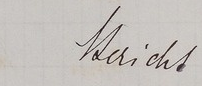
Bericht
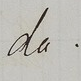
da.
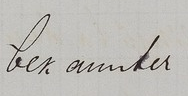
bekannter
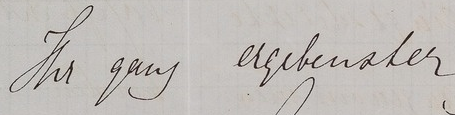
Ihr ganz ergebenster
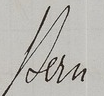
Bern
